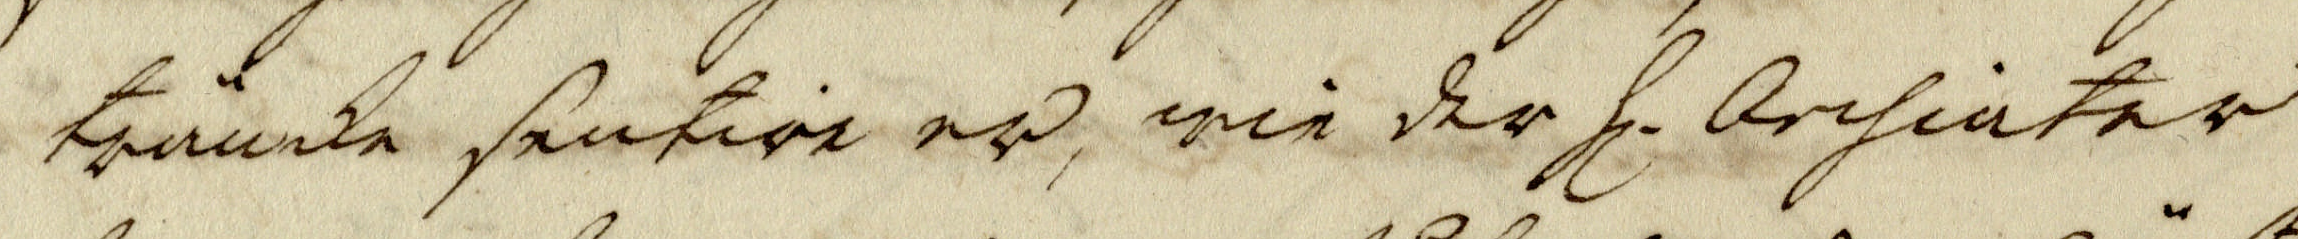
träncke sentire er, wie der H. Archiater
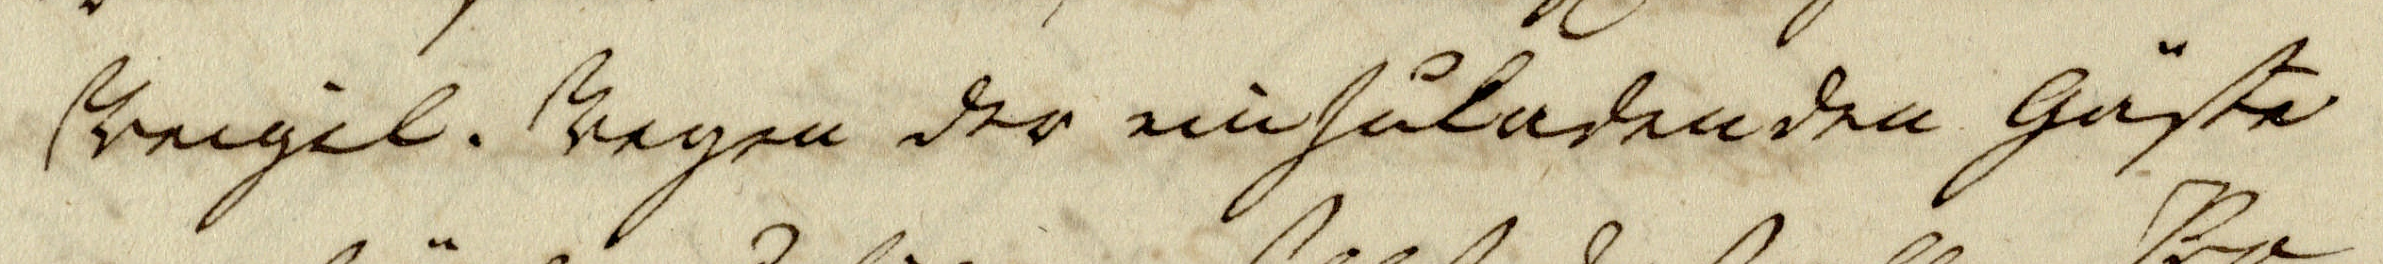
Weigel. Wegen der einzuladenden Gäste
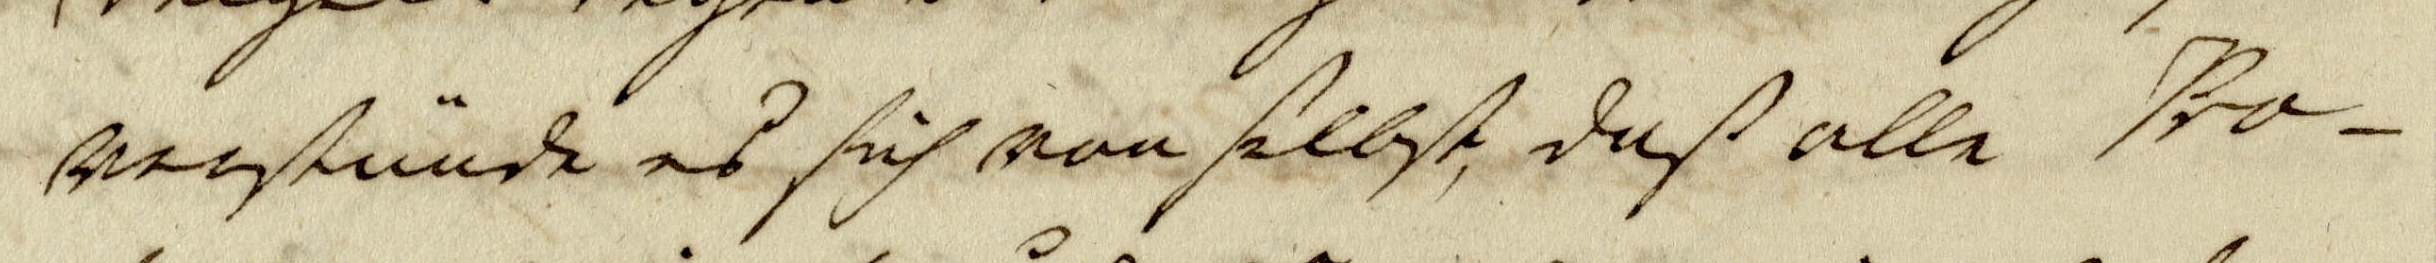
verstünde es sich von selbst, daß alle Pro¬
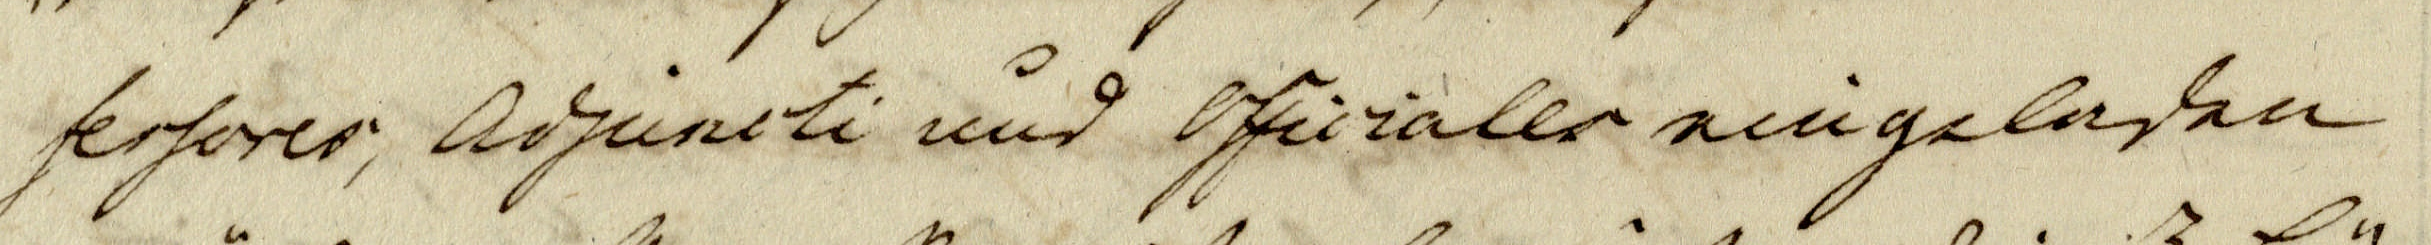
fessores, Adjuncti und Officiales eingeladen
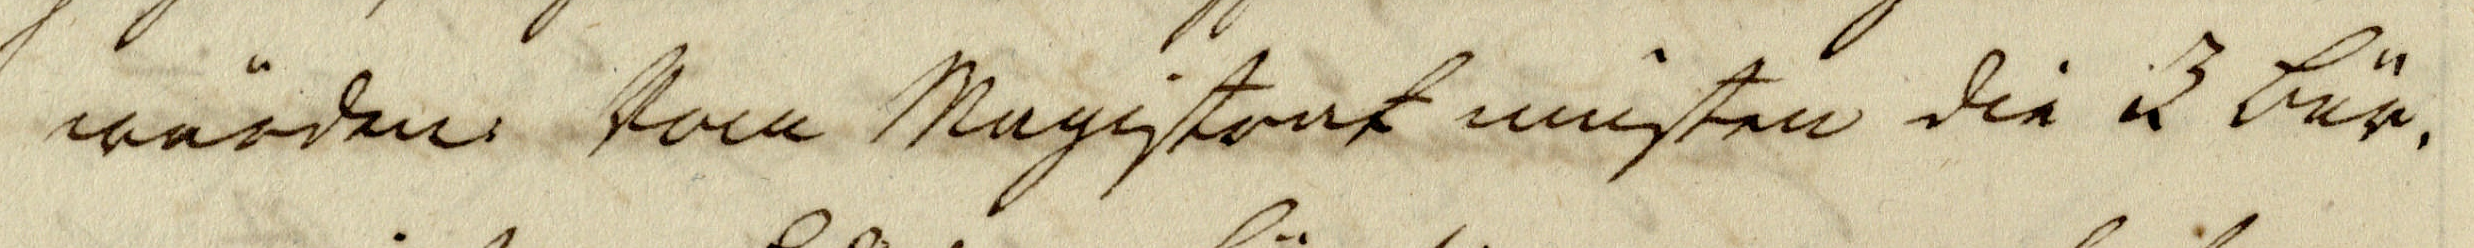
würden: Vom Magistrat müßten die 3 Bür¬
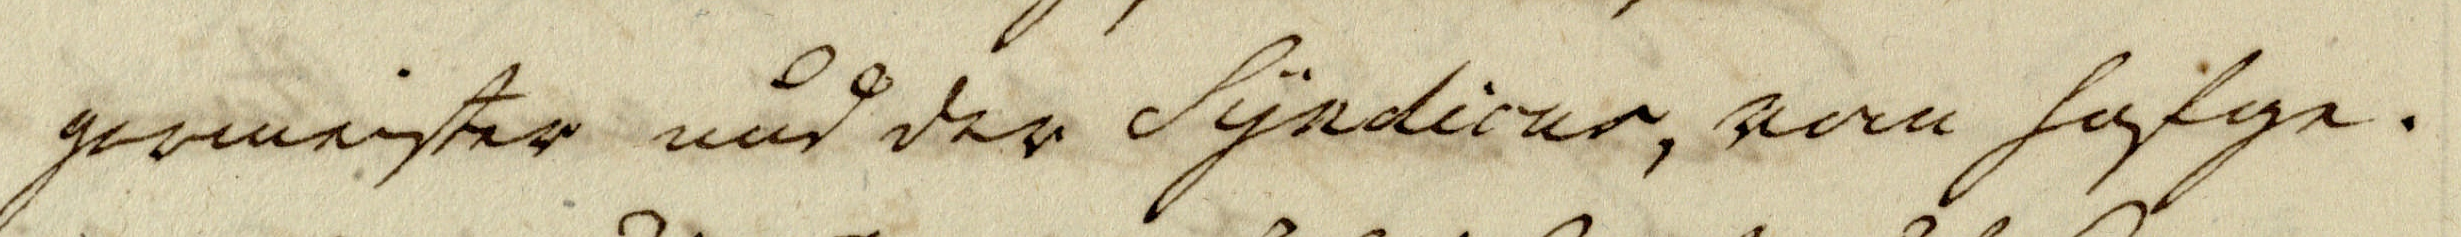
germeister und der Sÿndicus, vom Hofge¬
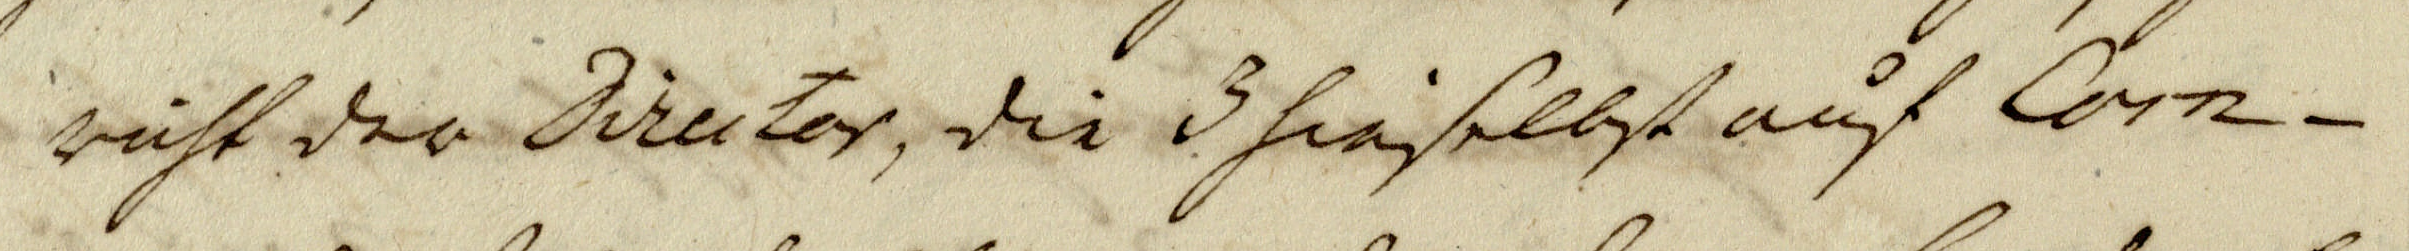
richt der Director, die 3 hieselbst auf Com¬
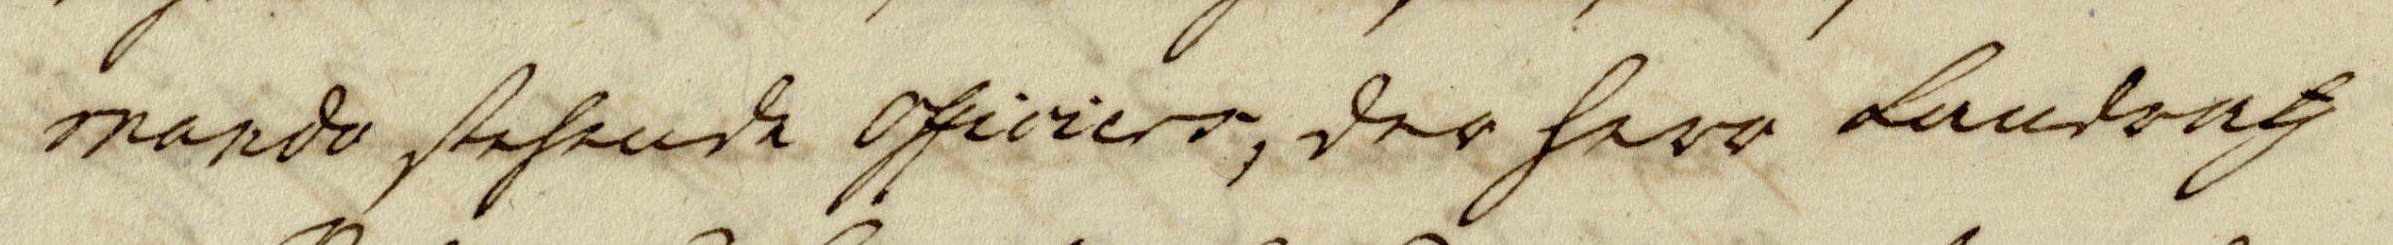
mando stehende Officiers, der Herr Landrath
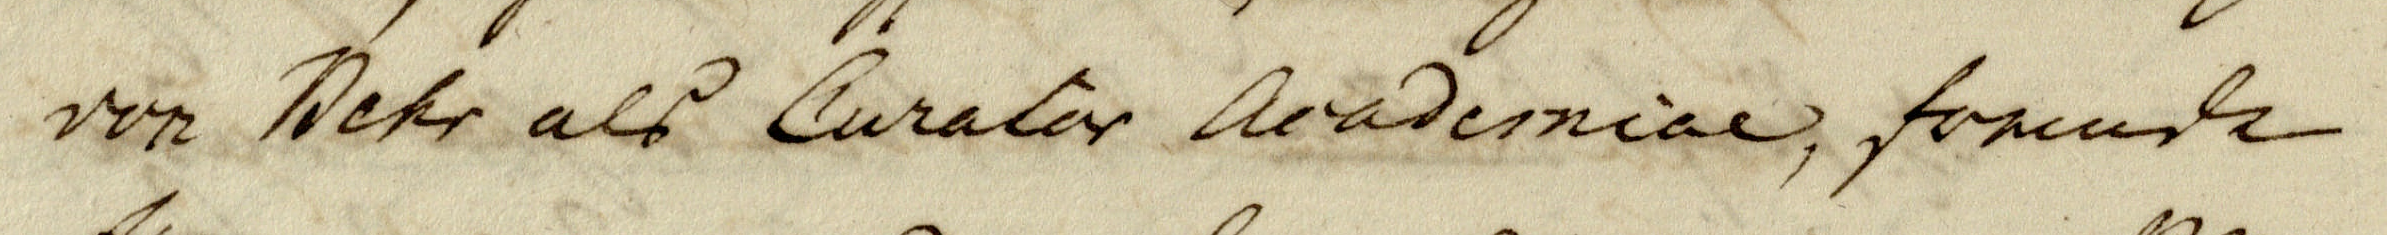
von Behr als Curator Academiae, fremde
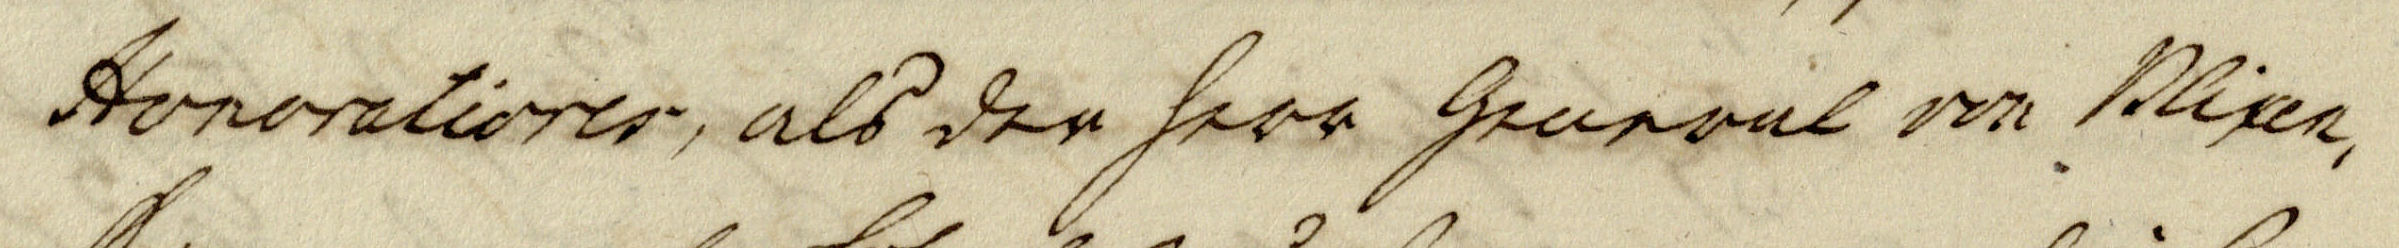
Honoratiores, als der Herr General von Blixen,
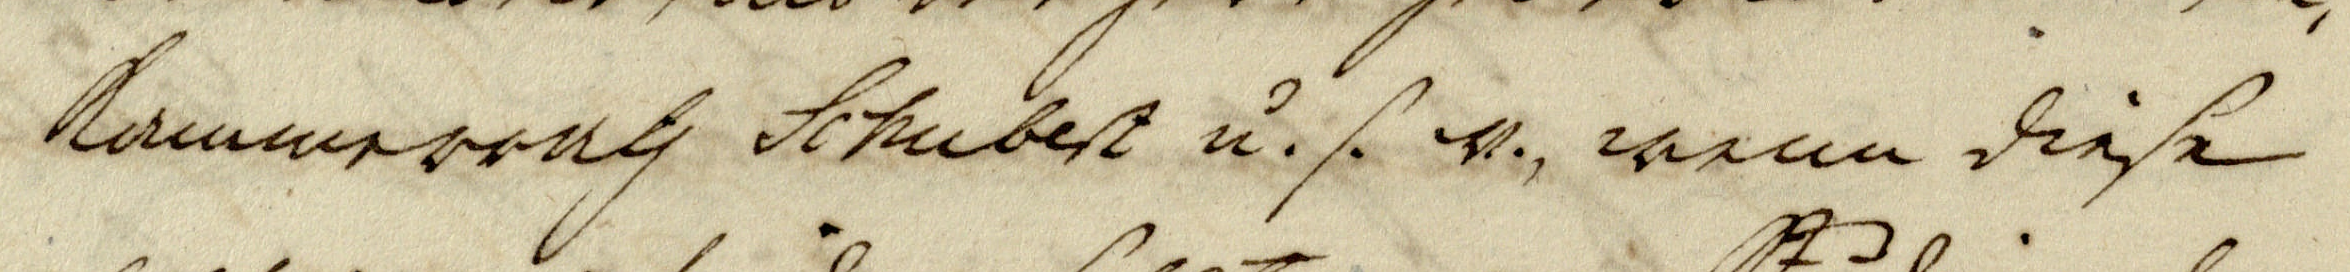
Kammerrath Schubert u. s. w., wenn diese
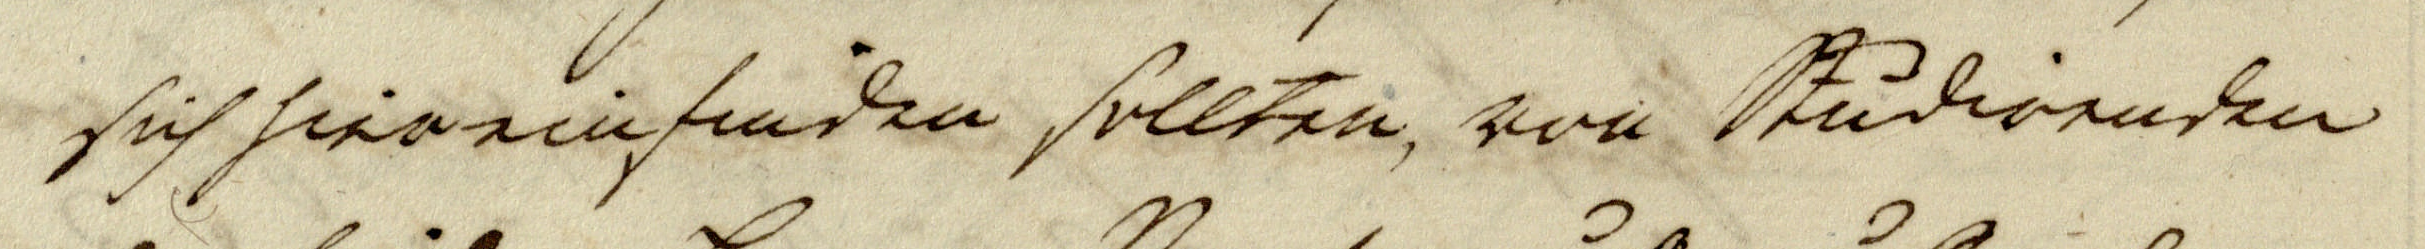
sich hier einfinden sollten, von Studirenden
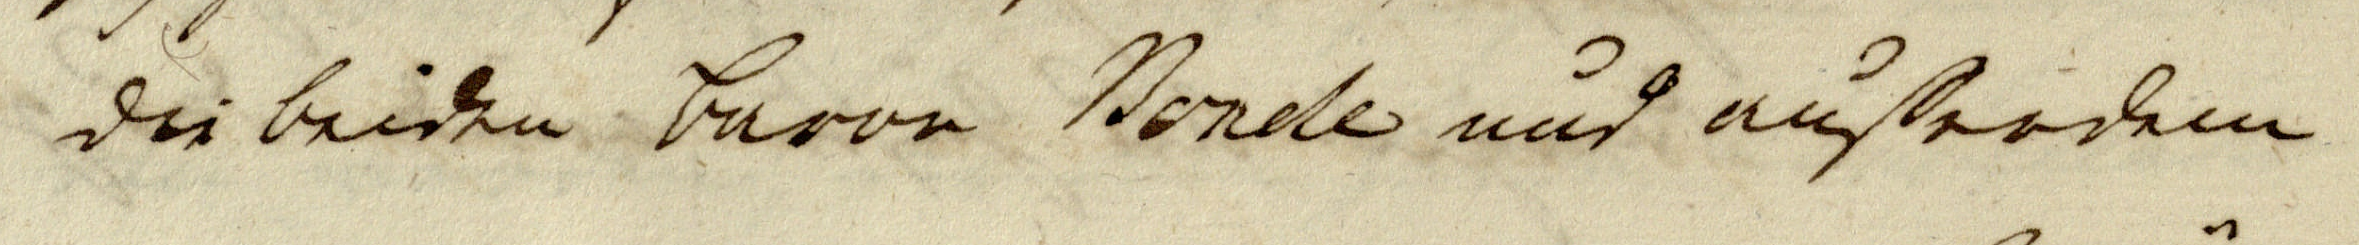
die beiden Baron Bonde und ausserdem
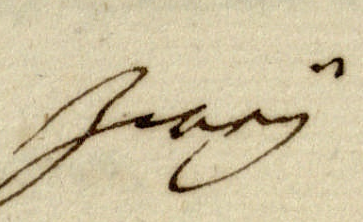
zweÿ
